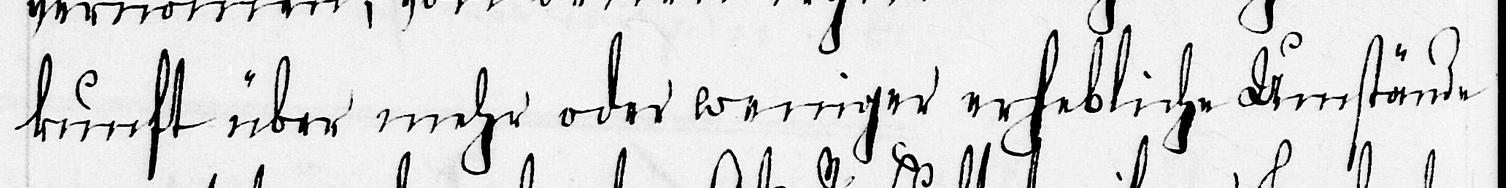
kunft über mehr oder weniger erhebliche Umstände
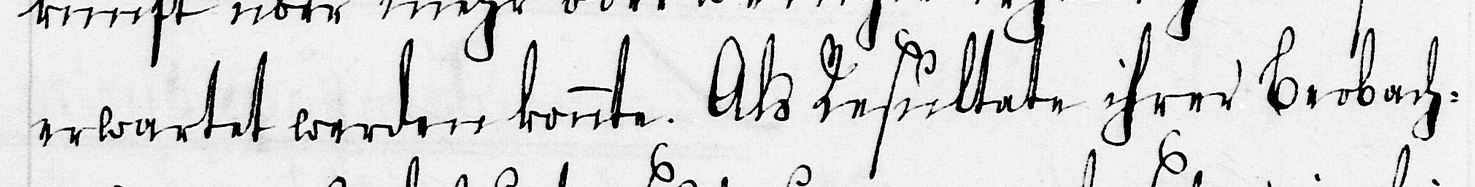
erwartet werden konnte. Als Resultate ihrer Beobach¬
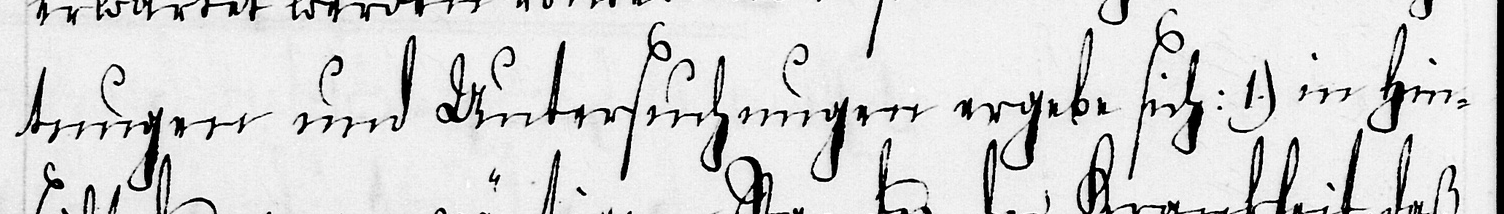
tungen und Untersuchungen ergebe sich: 1.) in Hin¬
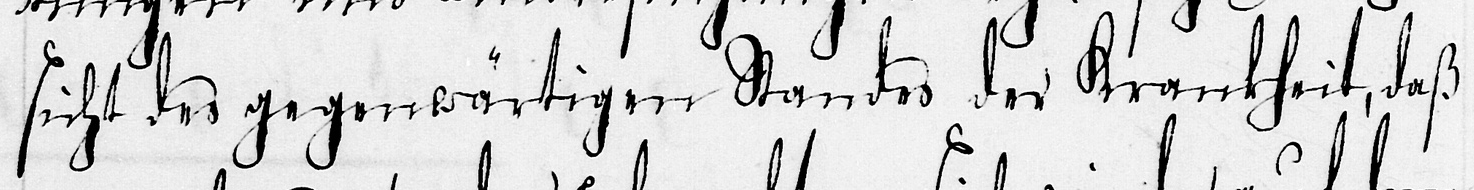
sicht des gegenwärtigen Standes der Krankheit, daß
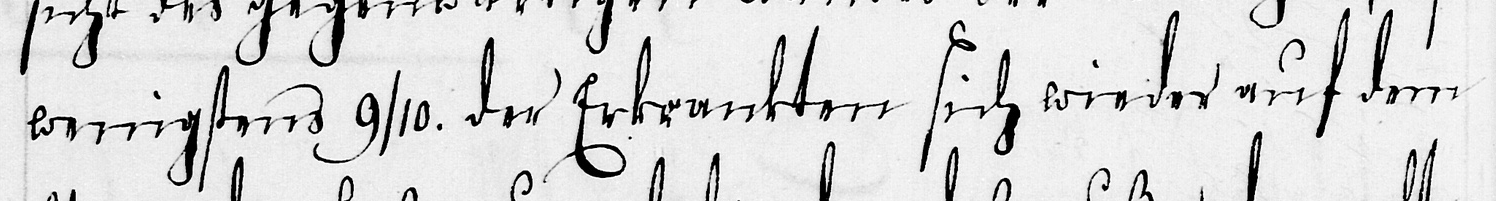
wenigstens 9/10. der Erkrankten sich wieder auf dem
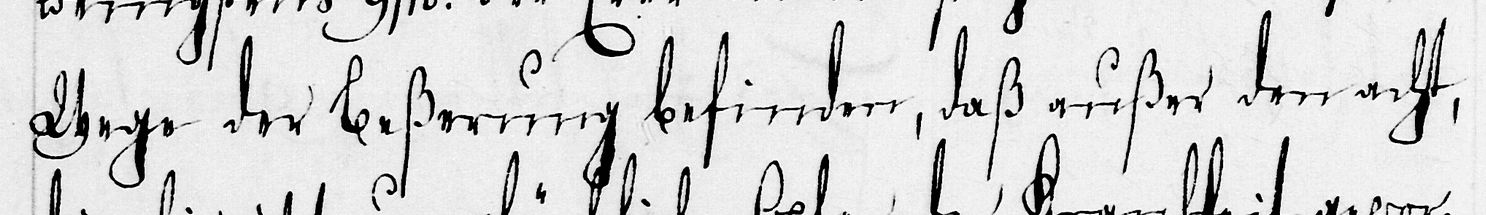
Wege der Beßerung befinden, daß außer den acht,
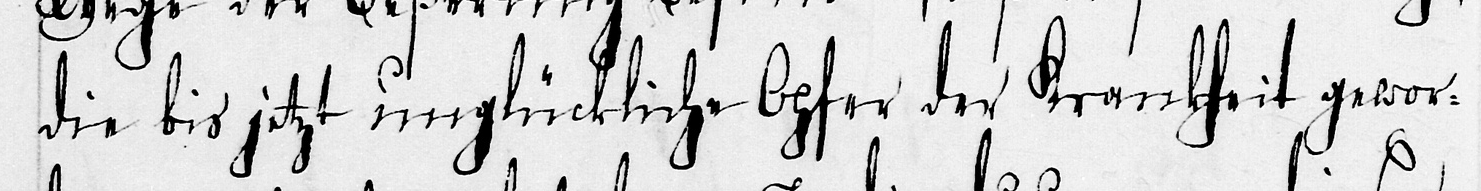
die bis jetzt unglückliche Opfer der Krankheit gewor¬
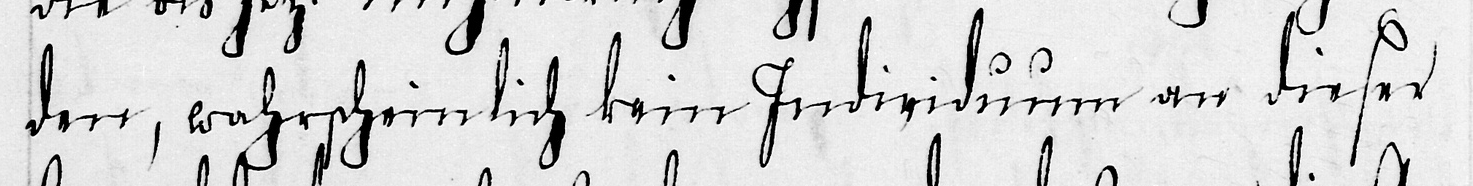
den, wahrscheinlich kein Individuum an dieser
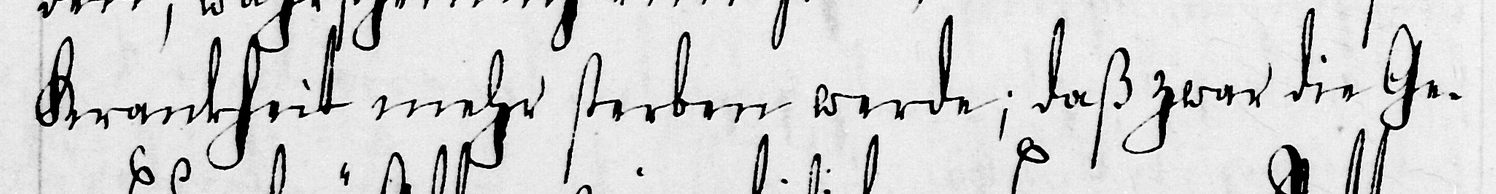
Krankheit mehr sterben werde; daß zwar die Ge¬
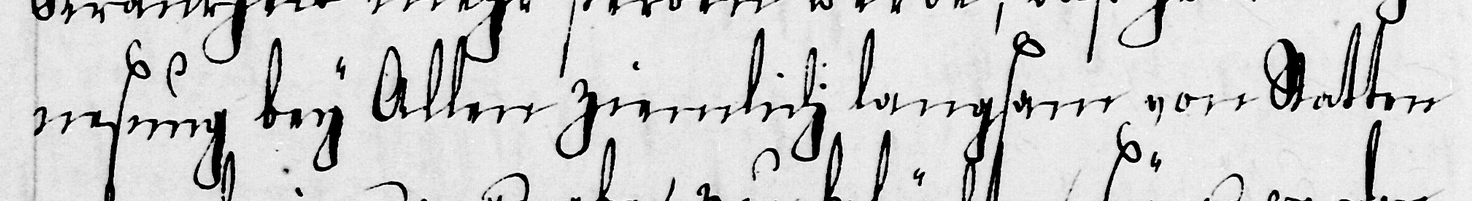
nesung bey Allen ziemlich langsam von Statten
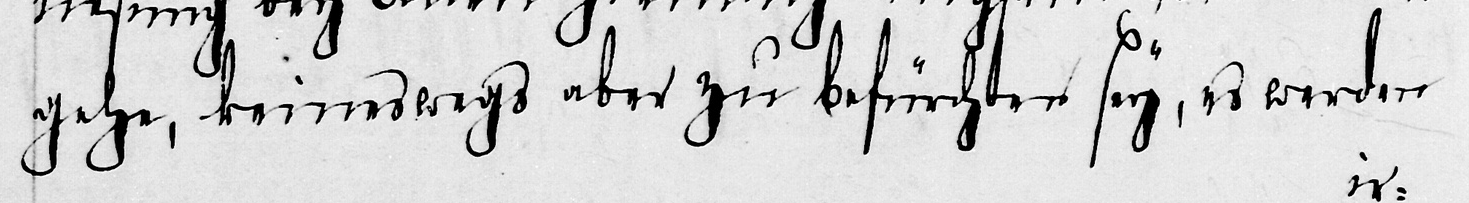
gehe, keineswegs aber zu befürchten sey, es werden
